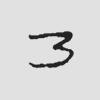乃
